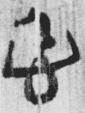○（年）
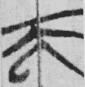而
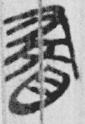畫
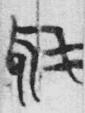於
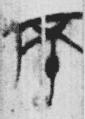伾（背）
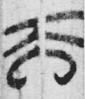而
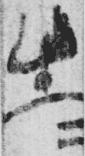生生
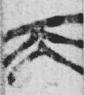而
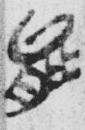能
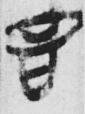言
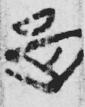是
